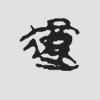復
